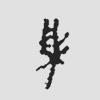味
